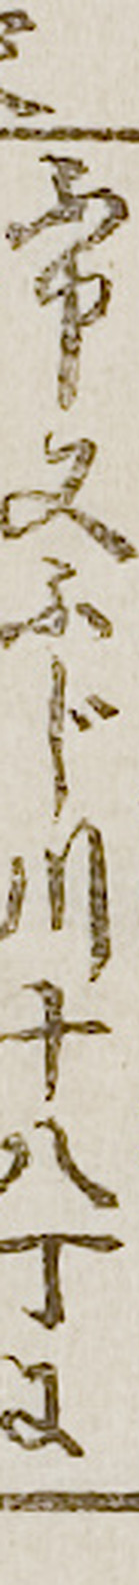不申又ふじ川十八丁に
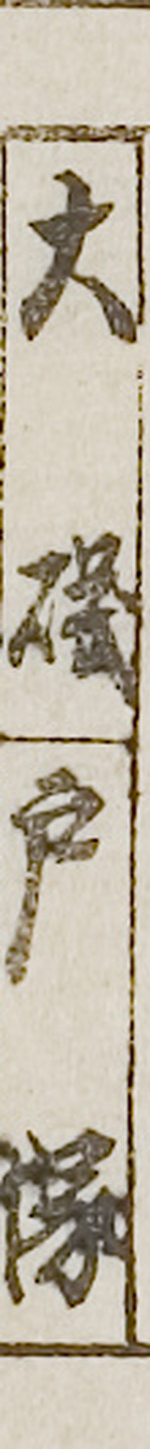大磯戸塚
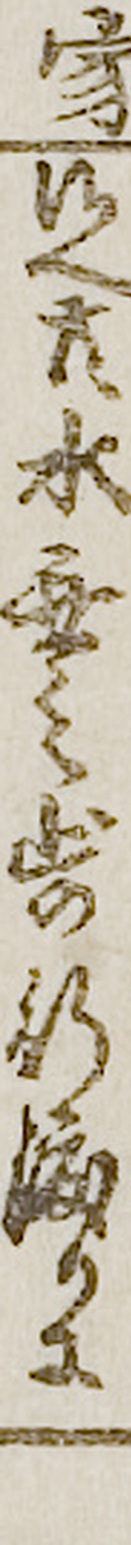候へ共水無之歩行渡りに
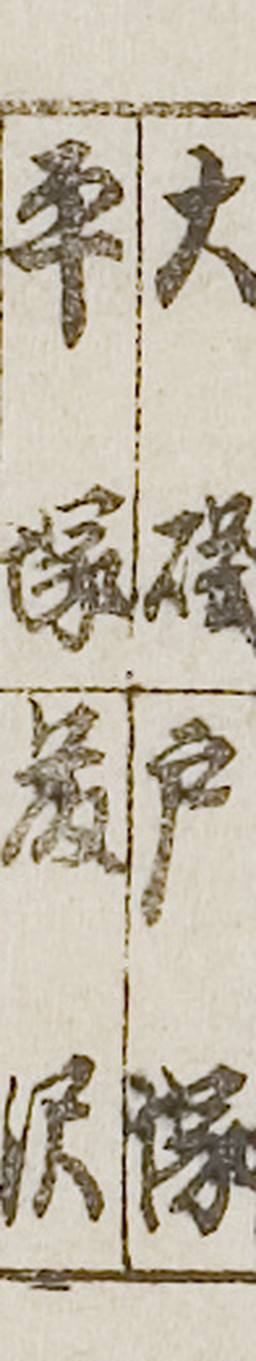平塚藤沢
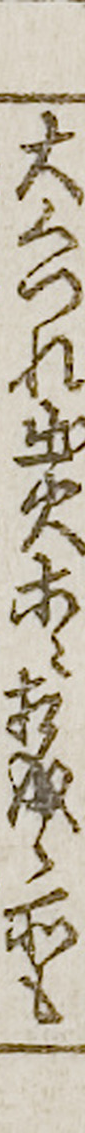大くつれ出火等々相成候所も
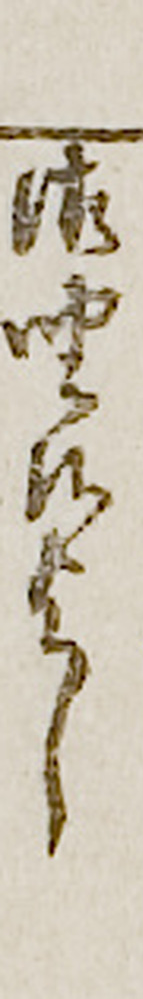御座候よし
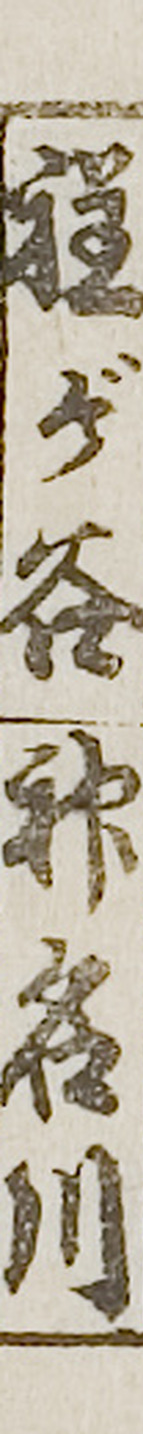程ゲ谷神名川
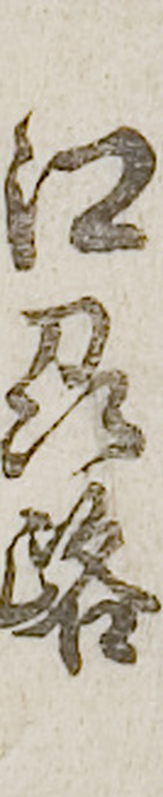江州路
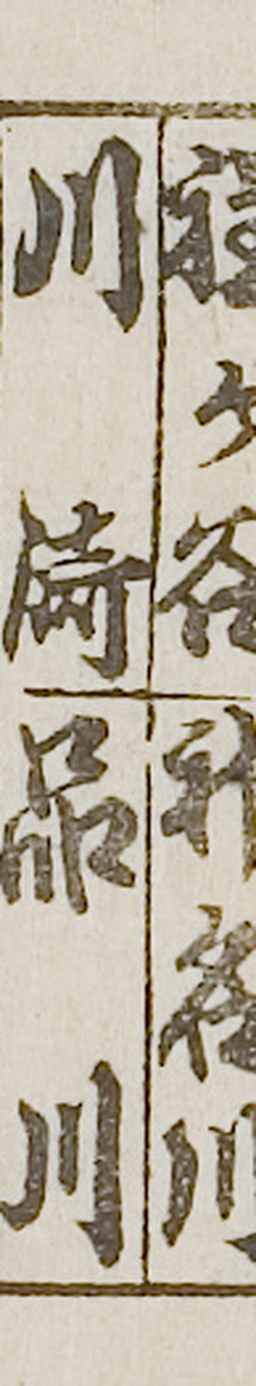川崎品川
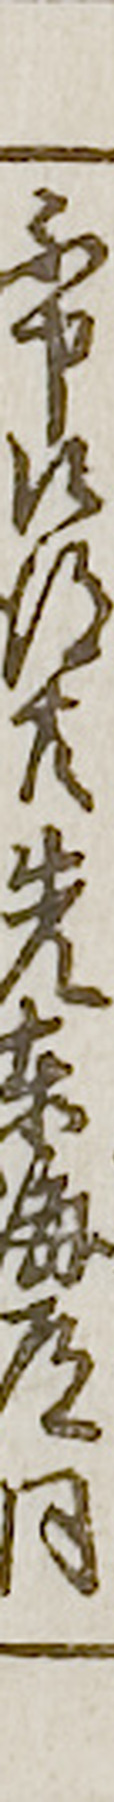不申候へ共先東海道同
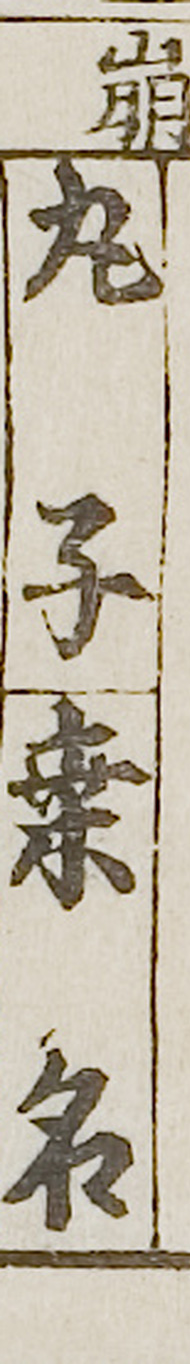丸子桑名
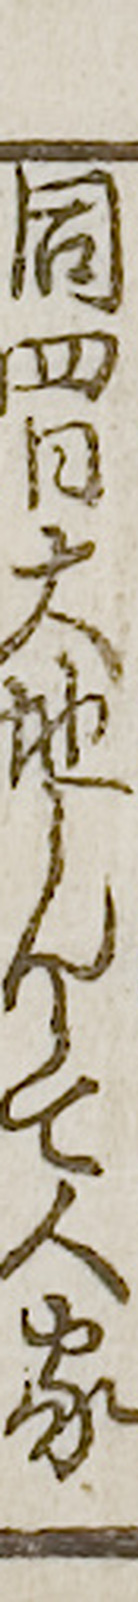同四日大地しんにて人家
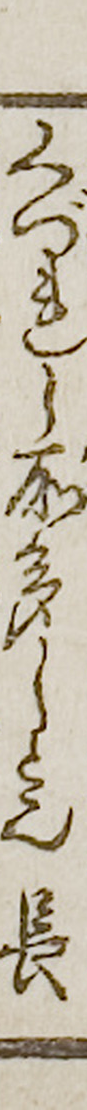くづれし所多しと也長
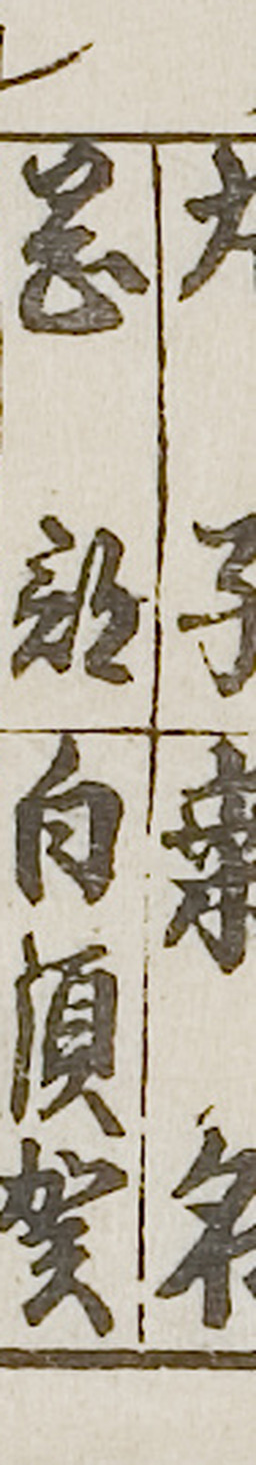岡部白須賀
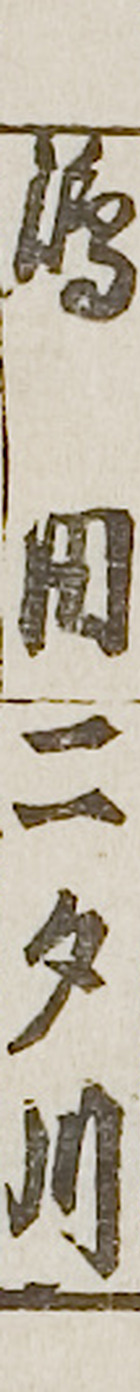嶋田二タ川
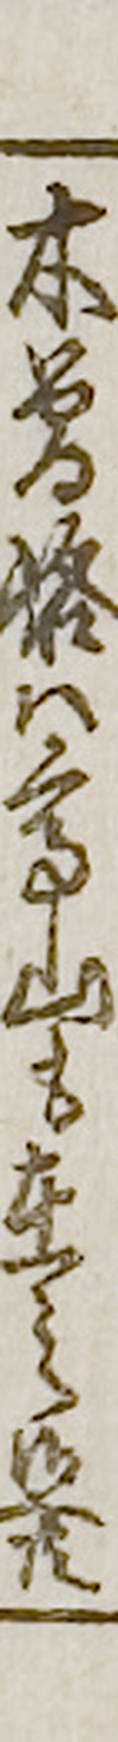木曽路は高山も在之候へ共
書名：大阪大地震一覧
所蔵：東京大学総合図書館 General Library in the University of Tokyo, JAPAN
